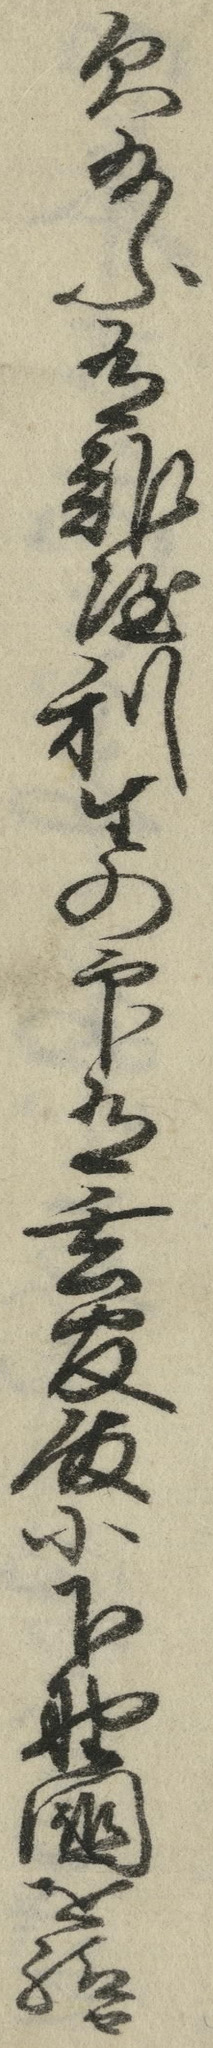欠給ふ有難や利生の印有玄官殿に下野國を給セ
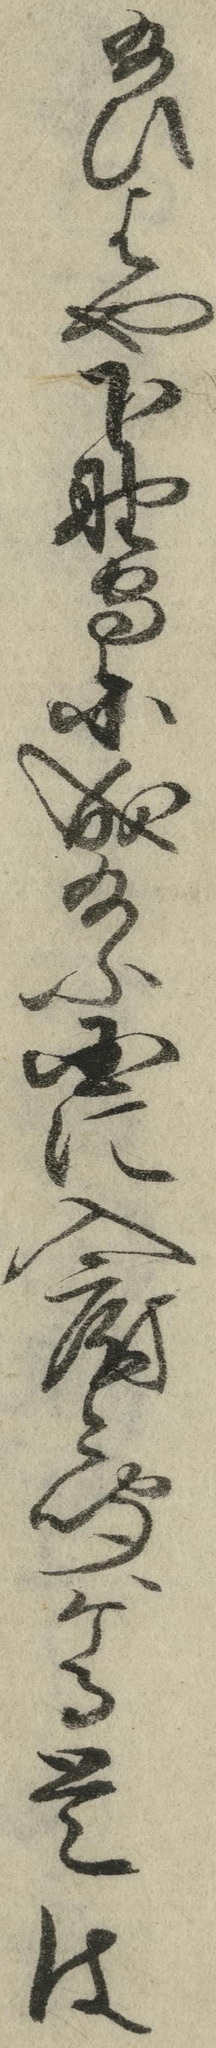給ひはや下野守に成給ふ国に入府と聞へける是は
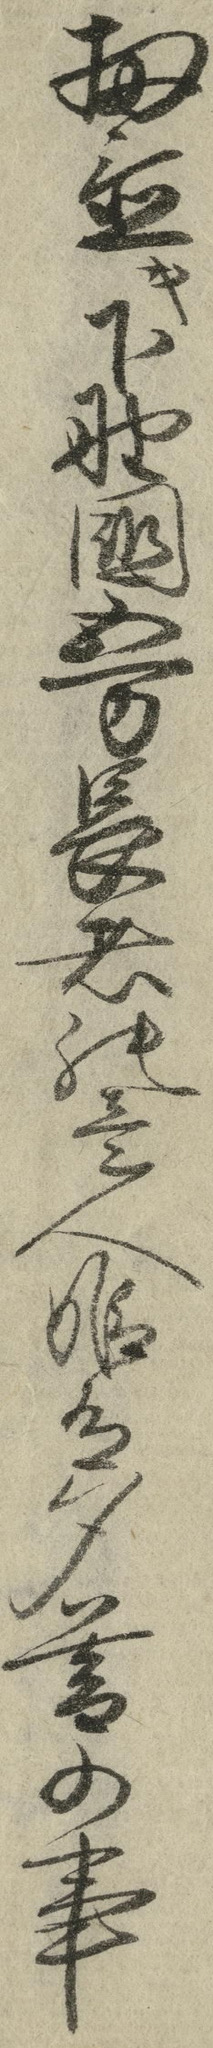扨置キ下野國五万長者の壱人姫有夕暮の事
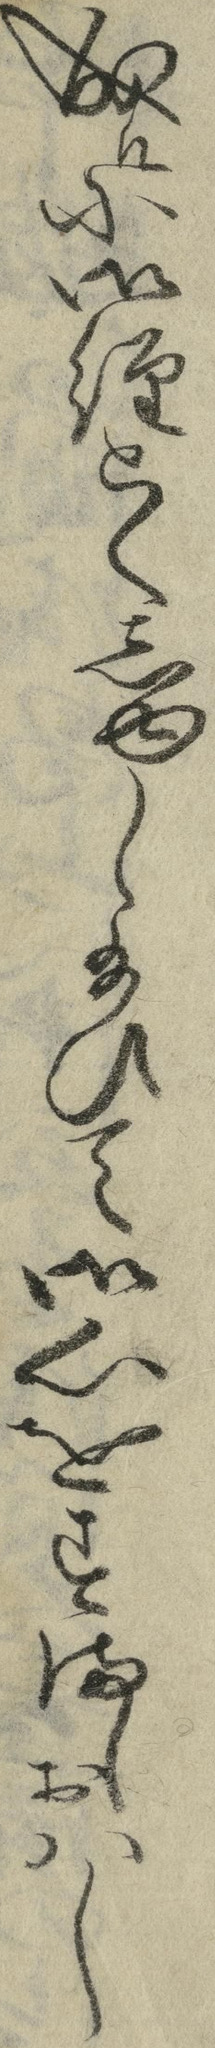成ルに御経とくしゆし給ひて御心をすましおはし
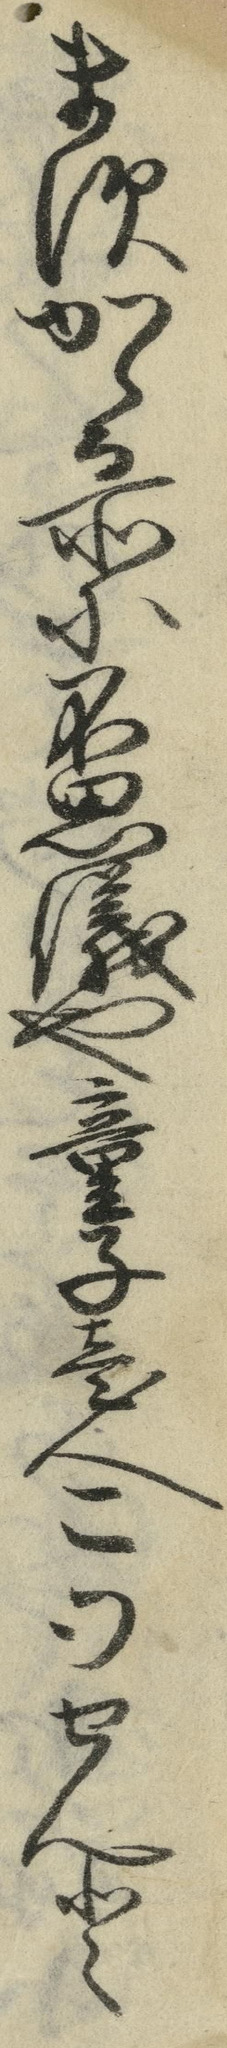ますかゝる所に不思議や童子壱人こつせんと
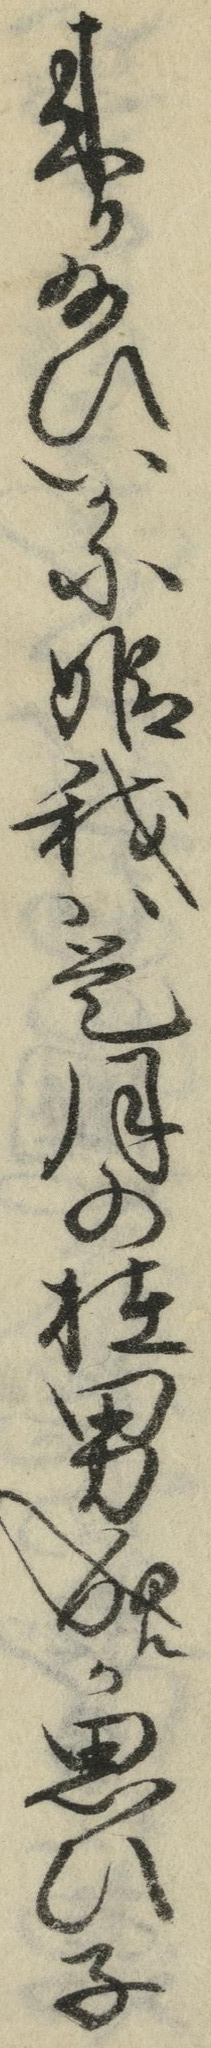来リ給ひいかに姫我は是月の桂男成ルか思ひ子
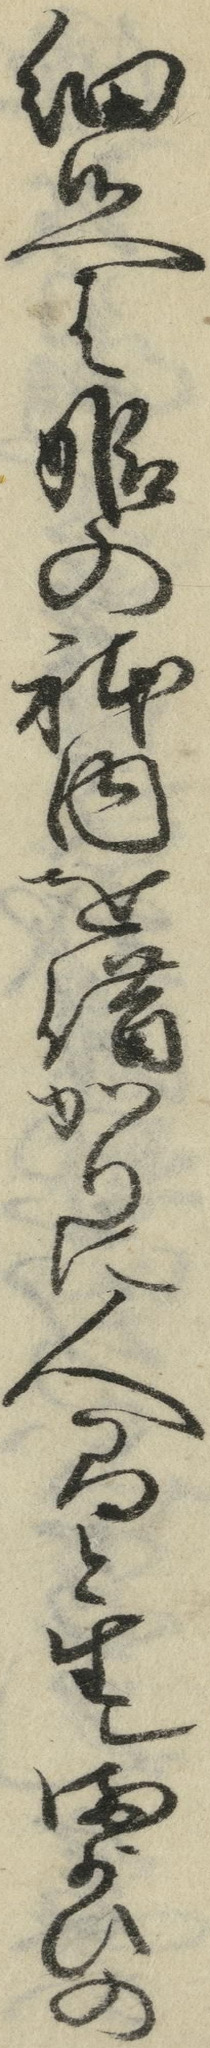細候へは姫の躰内を借かりに人間と生レまよひの
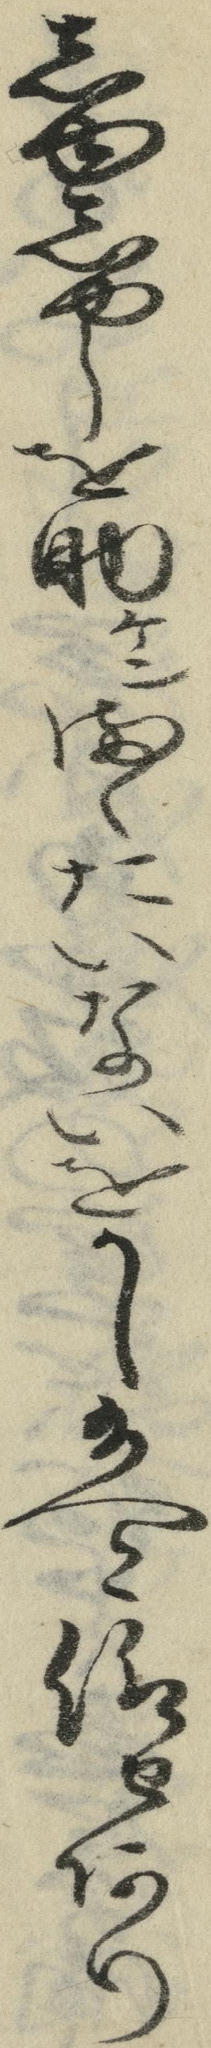しゆしやうを助ケンまゝたいないをかし給へと仰セあり
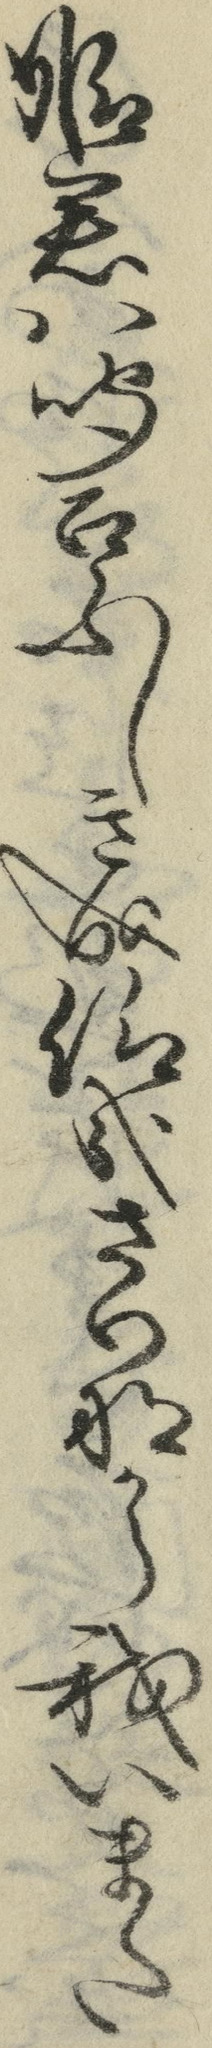姫君は聞召ふしき成仰哉さりなから我いまた
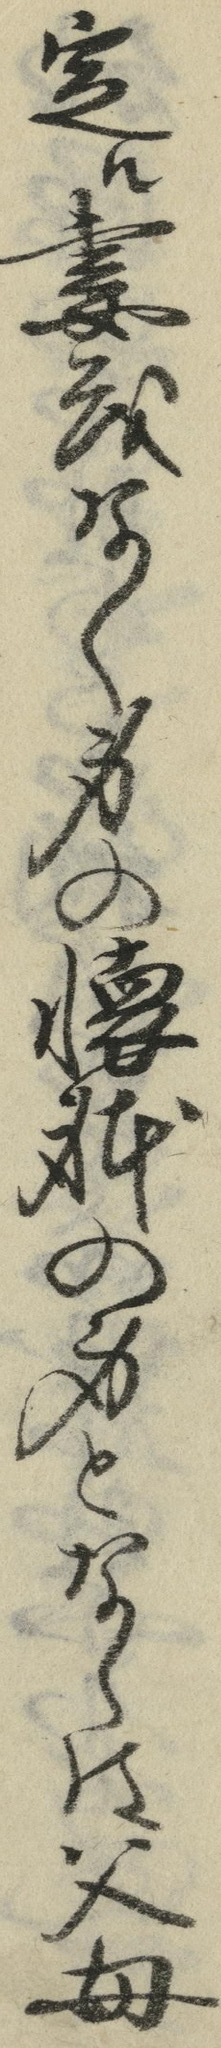定ル妻もなく身の懐躰の身とならは父母
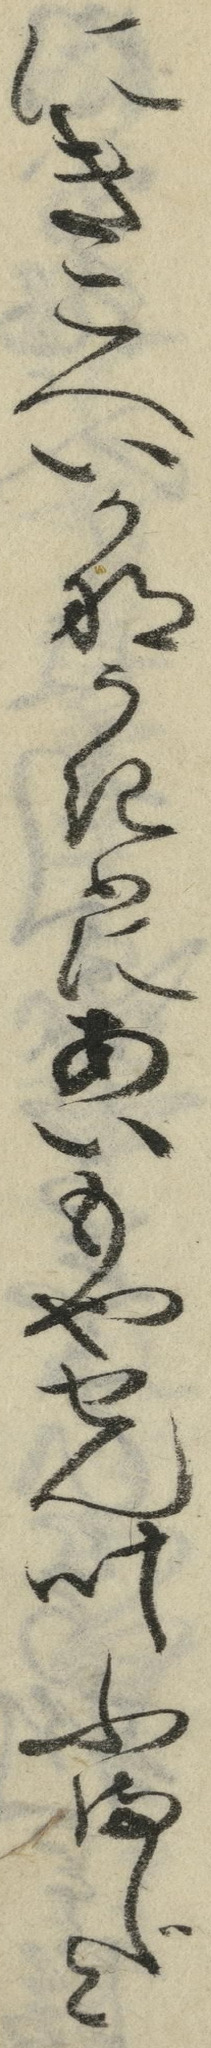にきこへいかなうきめにあいもやせん叶ふまじと
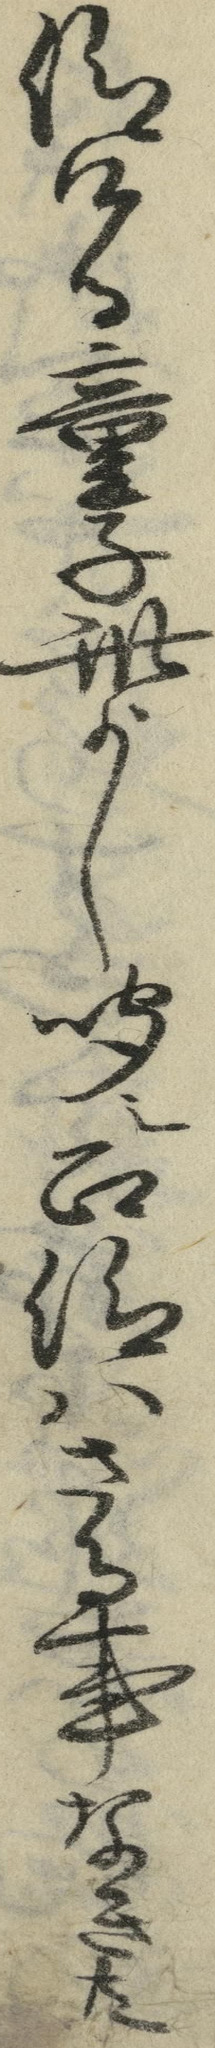仰ける童子此よし聞シ召仰はさる事なき共
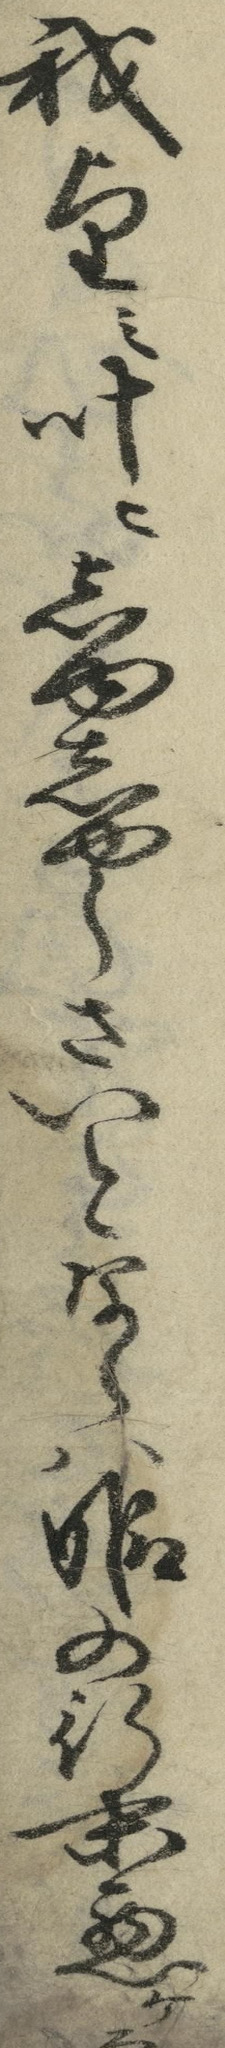我望ミ叶ヒしゆしやうさいとならは姫の行末悪ケる

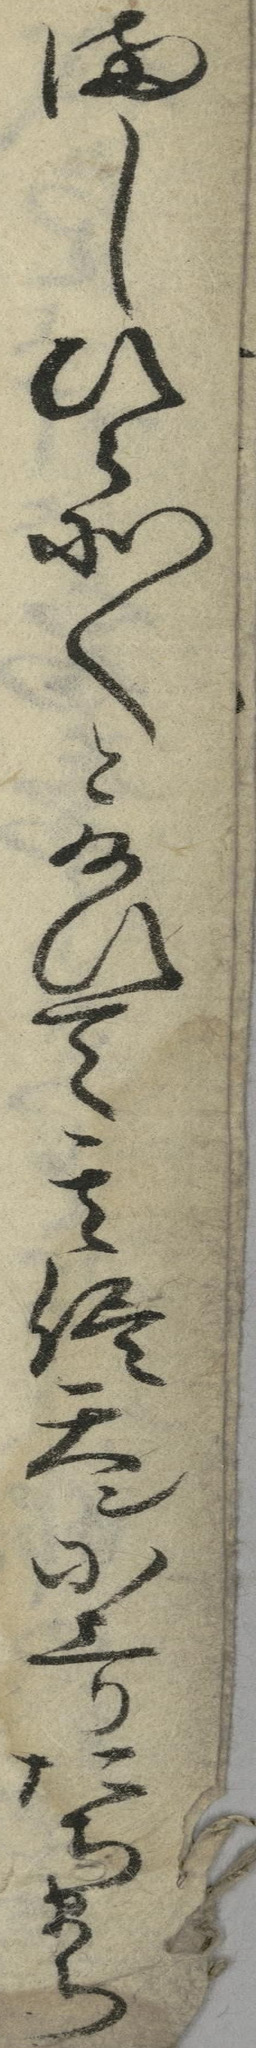ましひらに〳〵と給ひて其侭天ンに上りたちまち
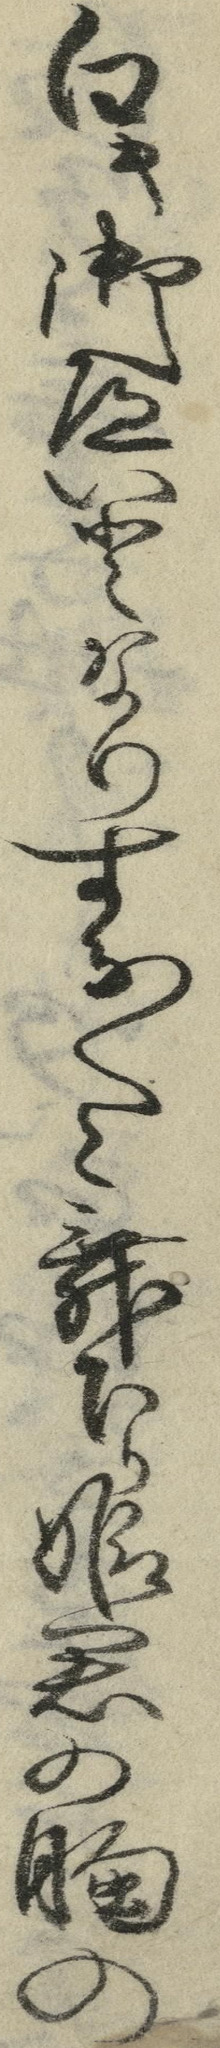白キ御へいとなりする〳〵と舞下り姫君の胸の
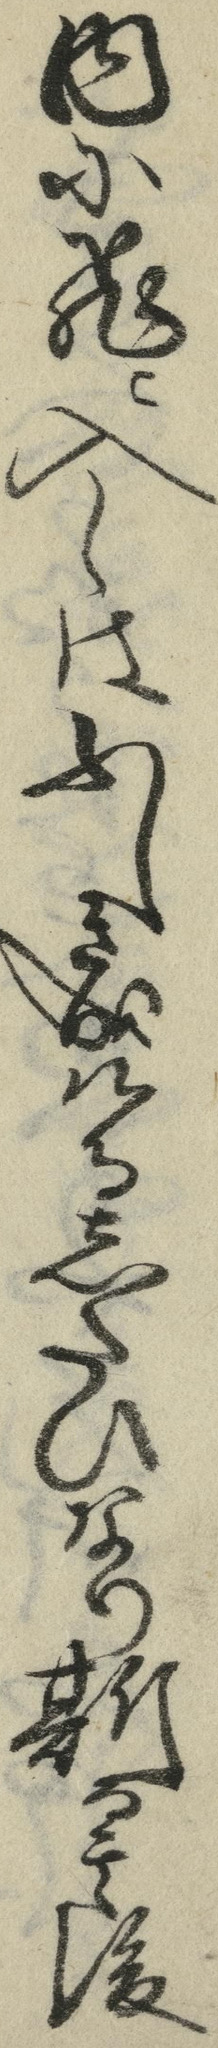内に飛ヒ入しはふしき成けるしたひなり斯て其後
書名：浅間記
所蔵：東京大学地震研究所図書室 Earthquake Research Institute Library, The University of Tokyo, JAPAN
